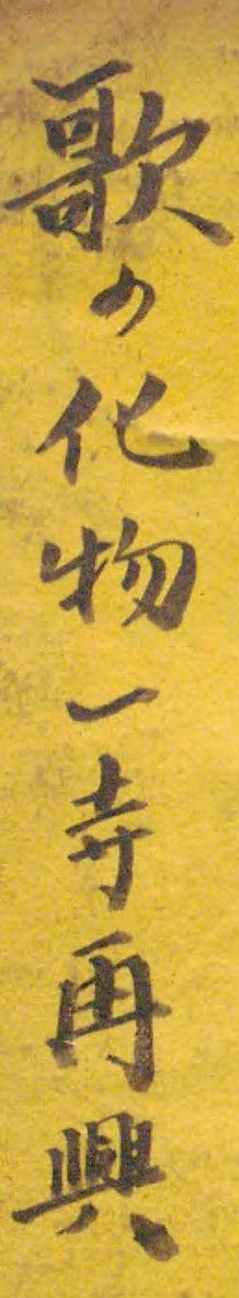歌の化物一寺再興

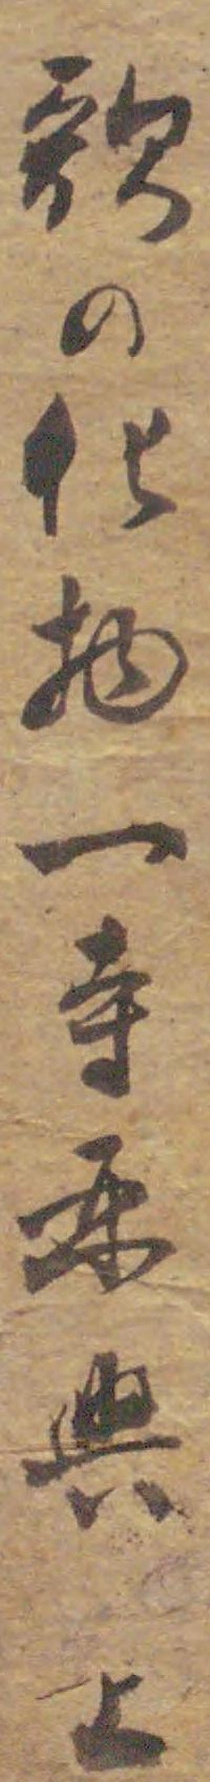歌の化物一寺再興上

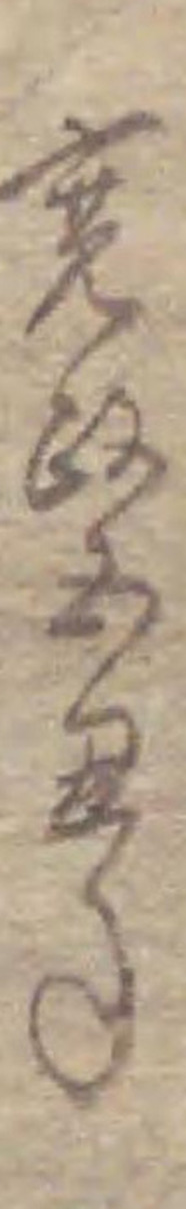寛政五丑年
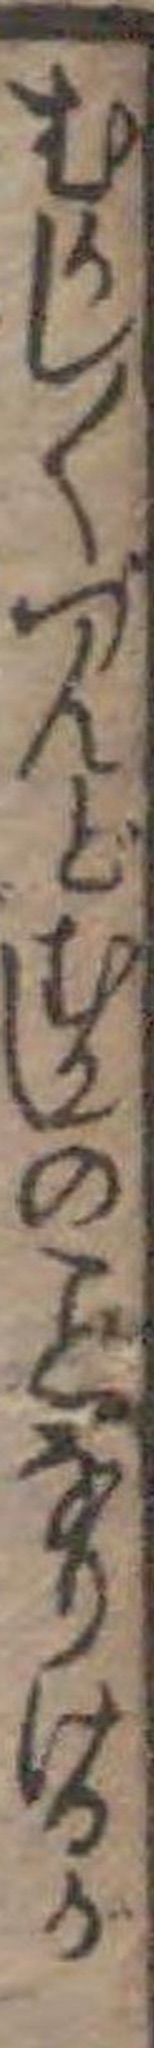むかし〳〵づんとむかしのことなりけるか
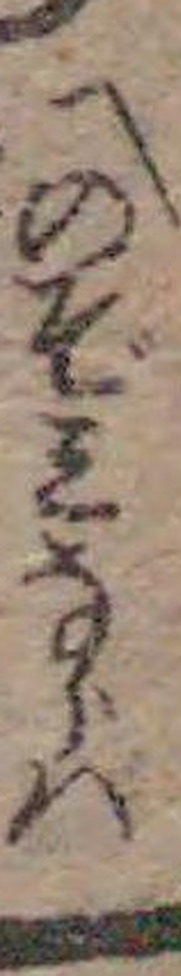〽のぞみならは
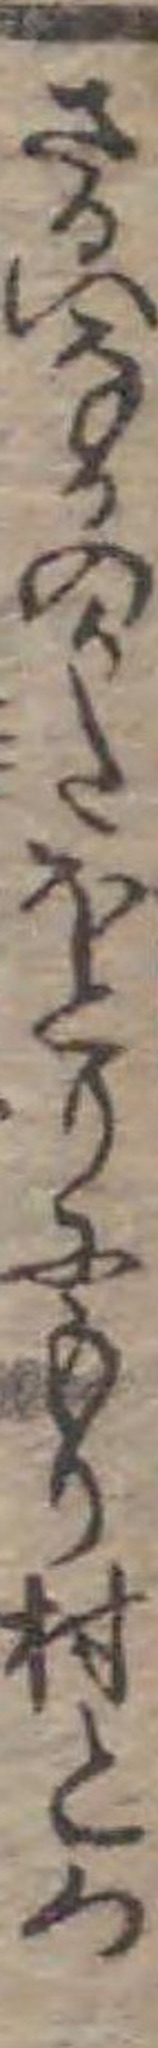さるいなかのかたほとりにもり村とか
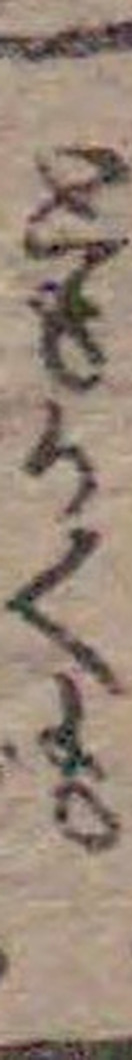ともかくも
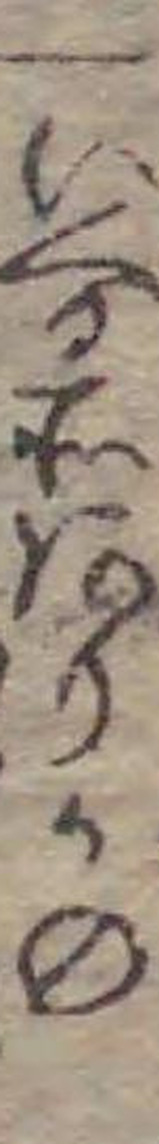いへる所ありかの
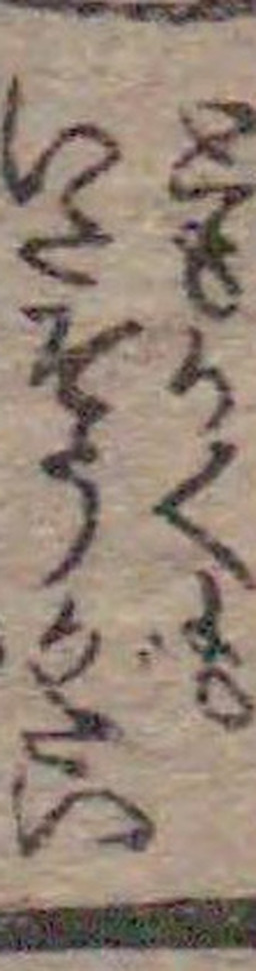いたそうがたい
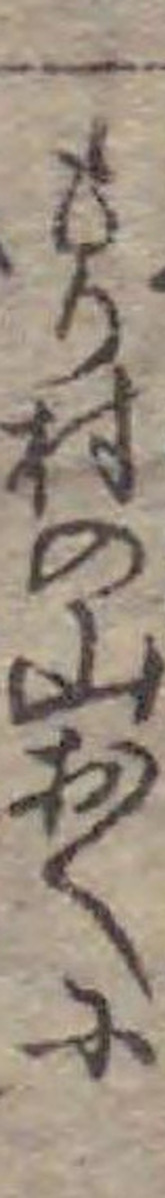もり村の山おくに
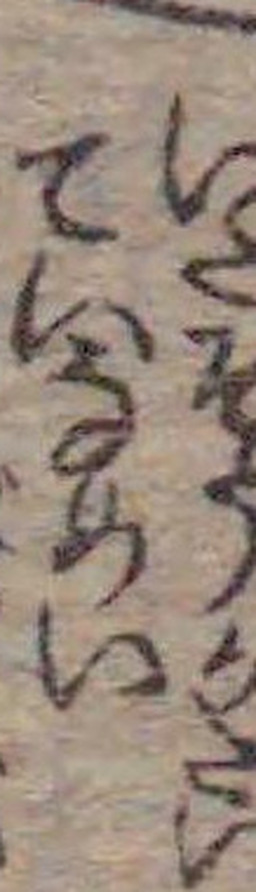ていなめい
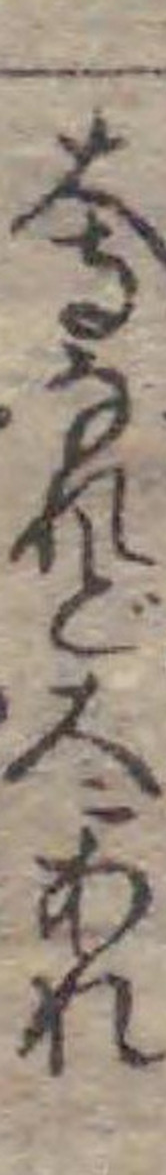大寺なれど大にあれ
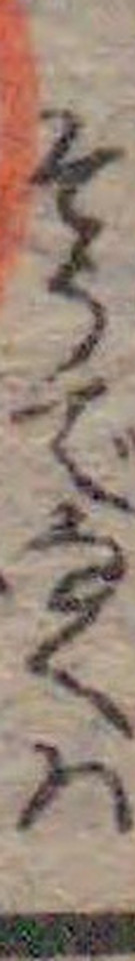そうでなくは
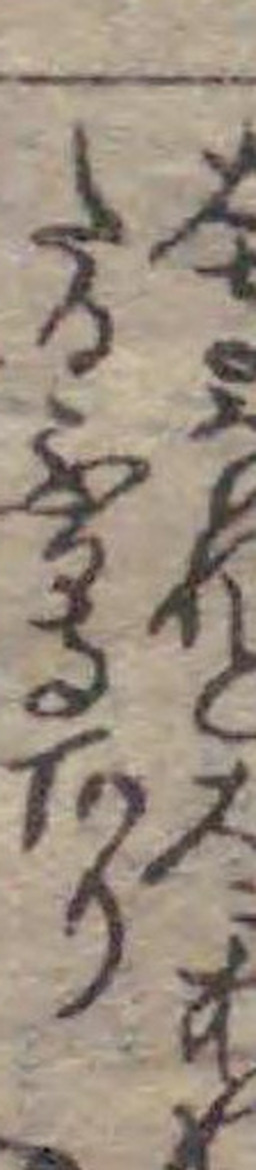たるふる寺あり
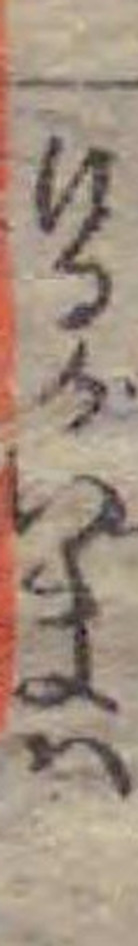けるがいまは
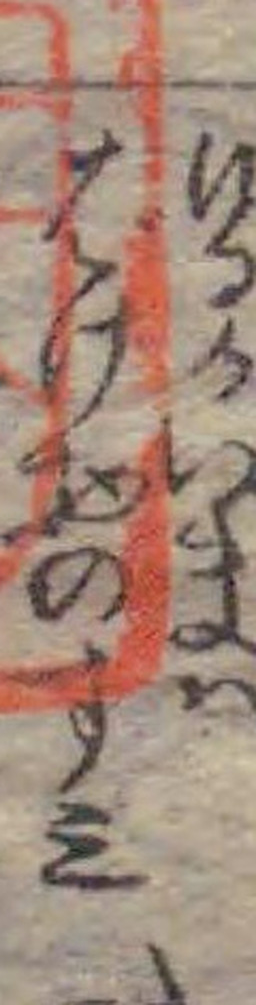ばけ物のすみ
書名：歌の化物一寺再興 : 2巻
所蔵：国立国会図書館 National Diet Library, JAPAN
